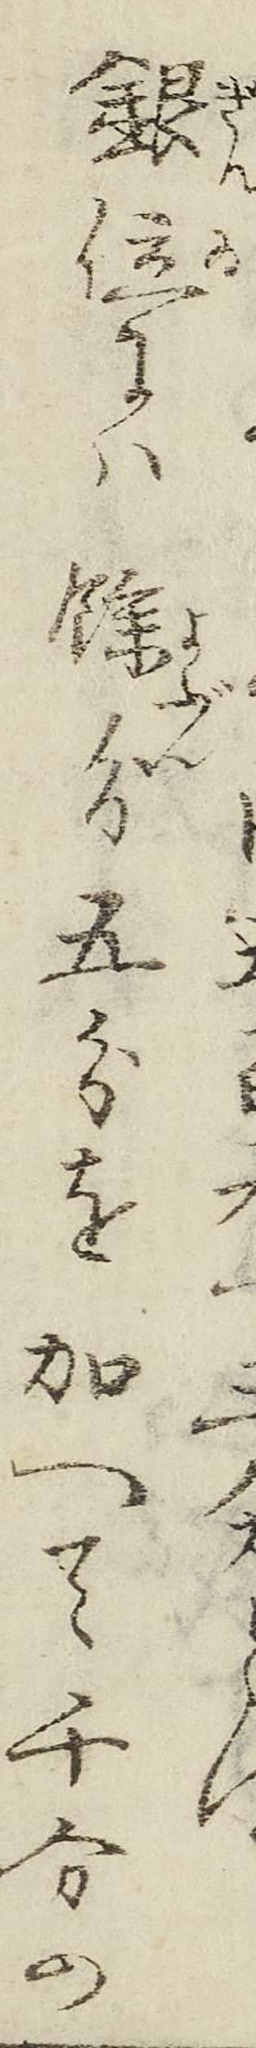銀位には余分五分を加へて千分の

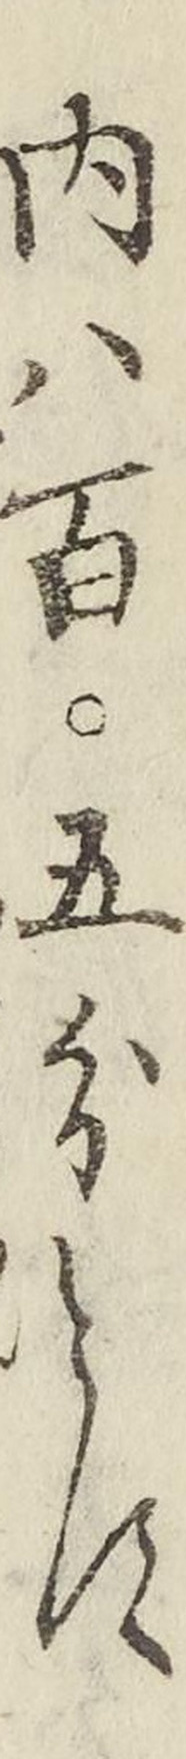内は百○五分とす
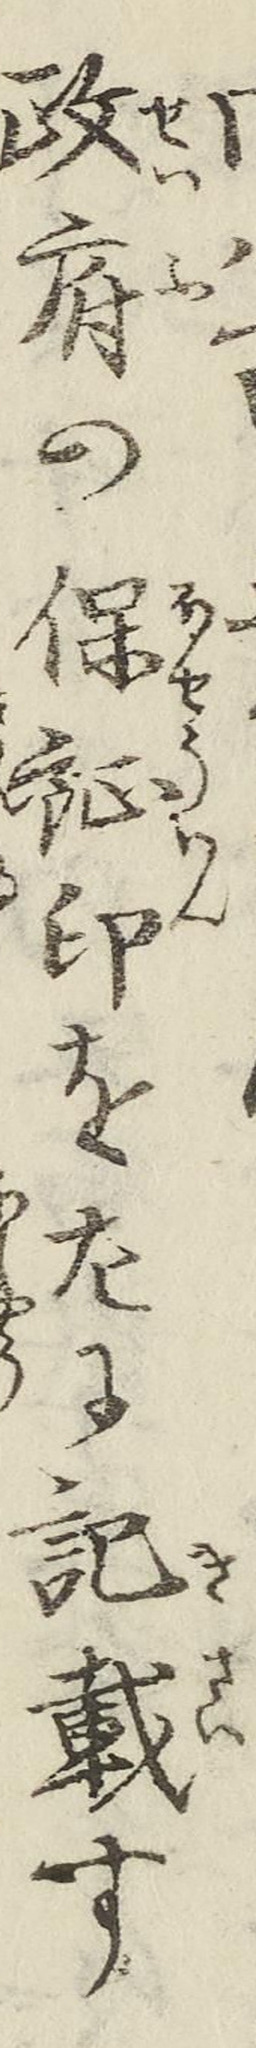政府の保証印を左に記載す
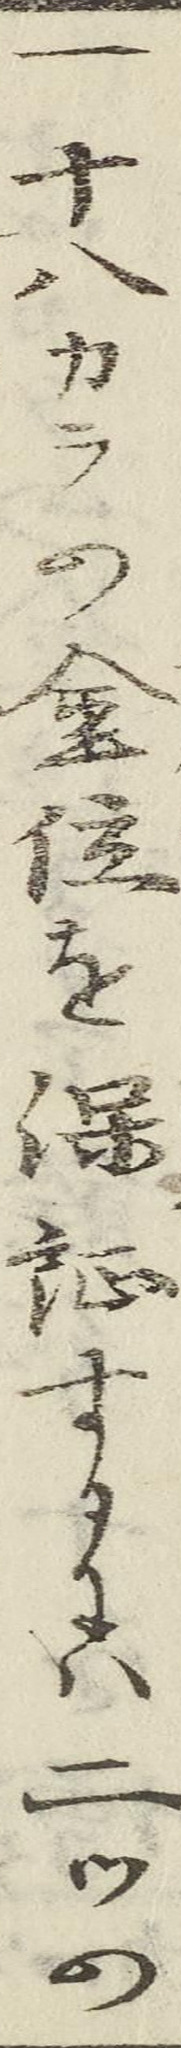一十八カラの金位を保証するには二ツの
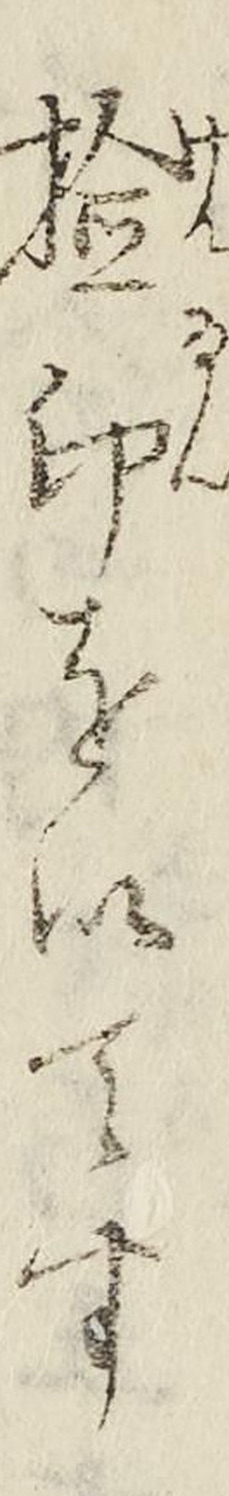検印を以てす
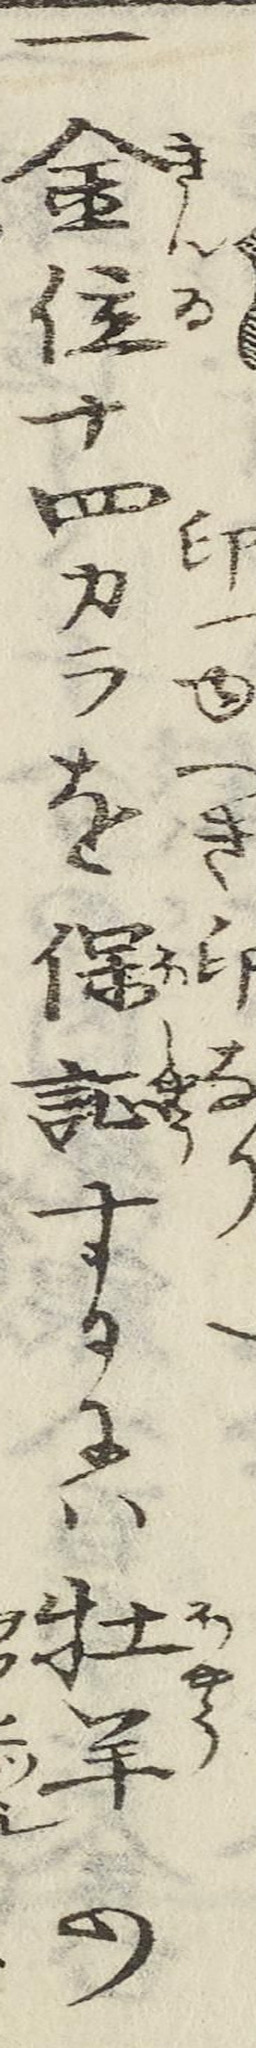一金位十四カラを保証するには牡羊の
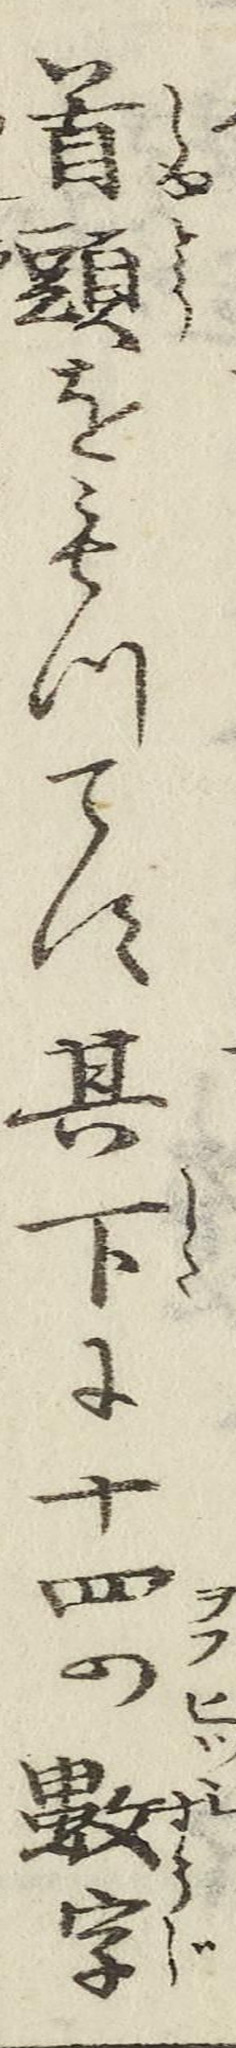首頭をもつてす其下に十四の数字
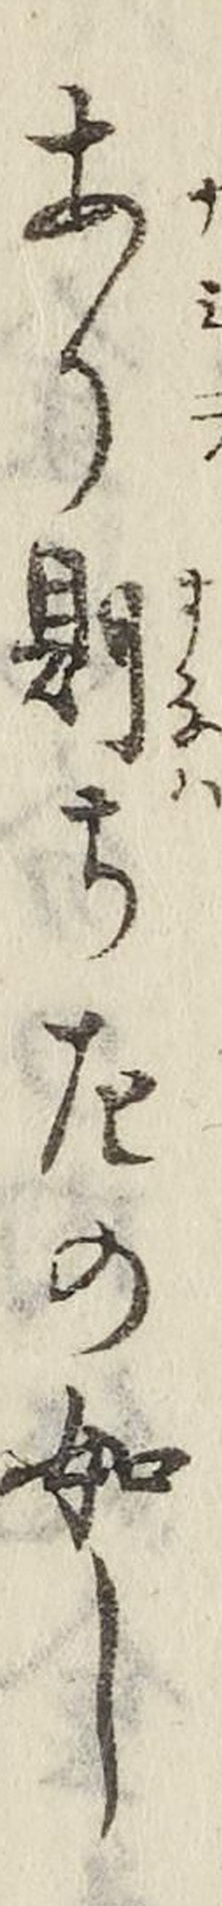あり則ち左の如し
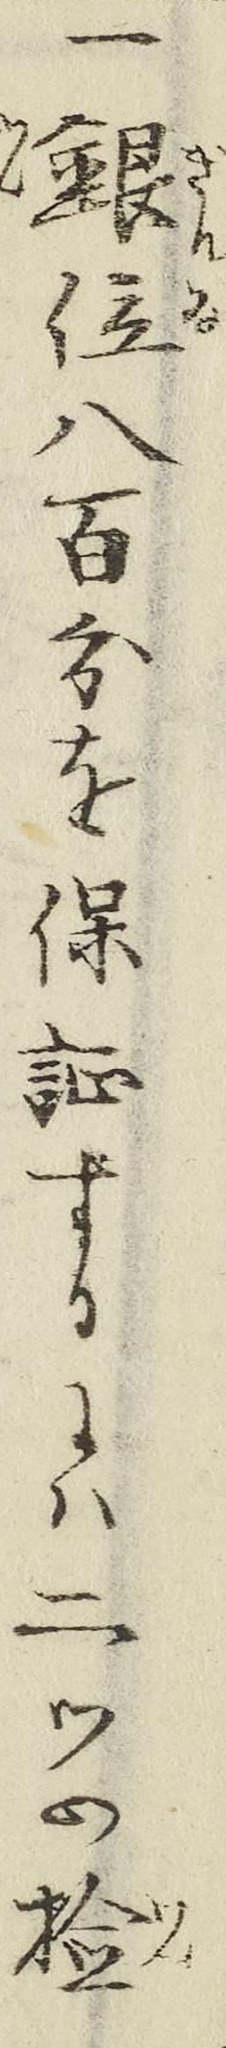一銀位八百分を保証するには二ツの検
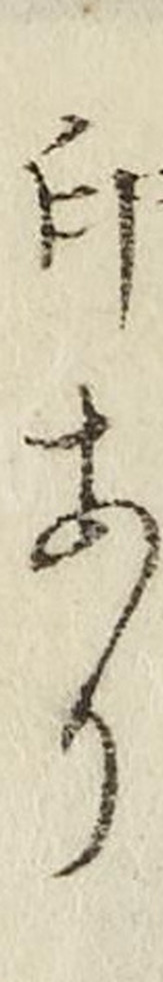印あり
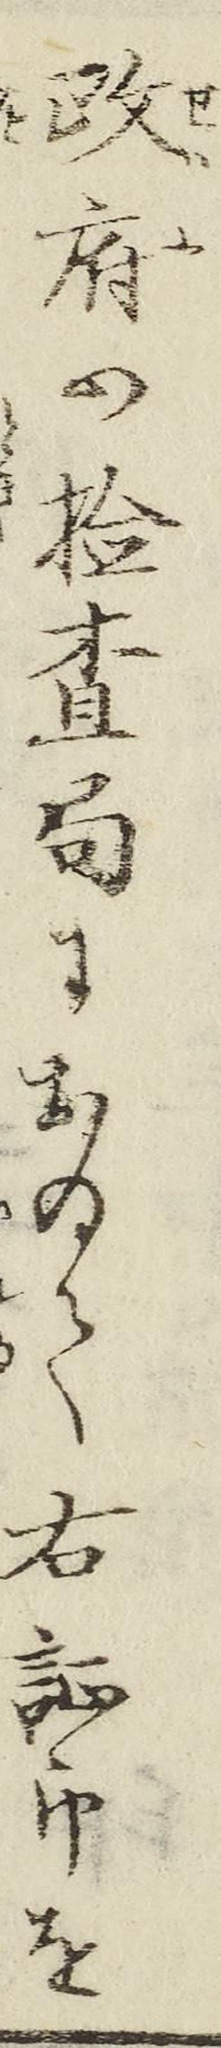政府の検査局において右証印を
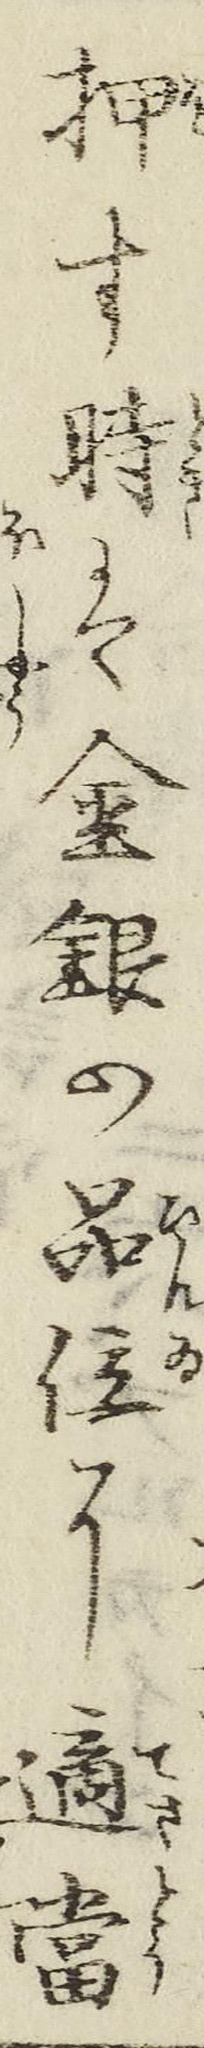押す時は金銀の品位に適当
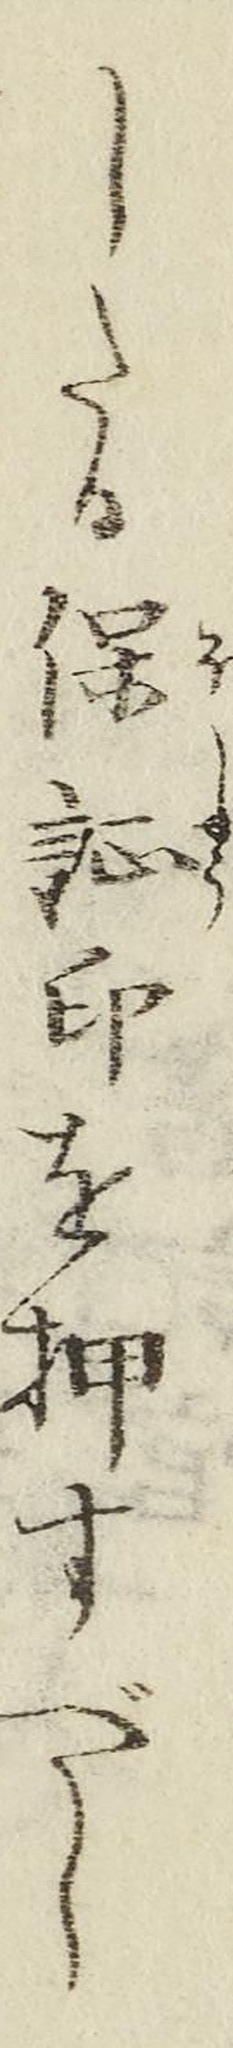したる保証印を押すべし
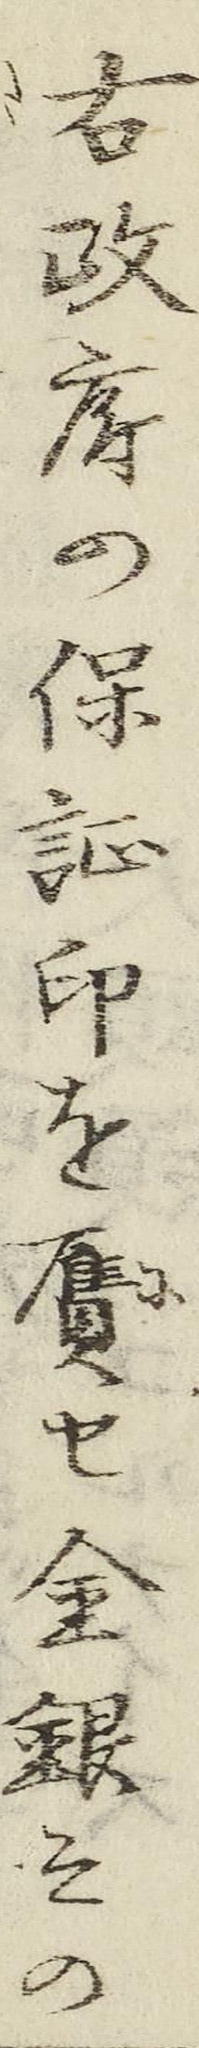右政府の保証印を贋せ金銀その
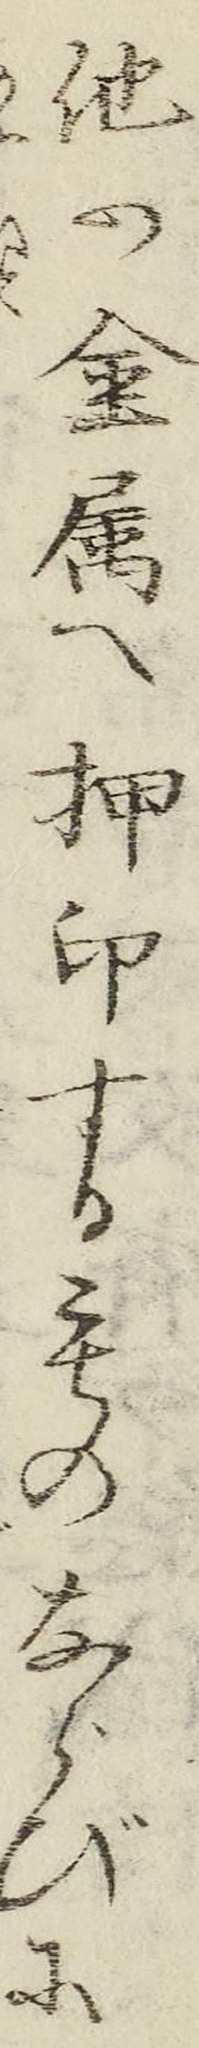他の金属へ押印するものならびに
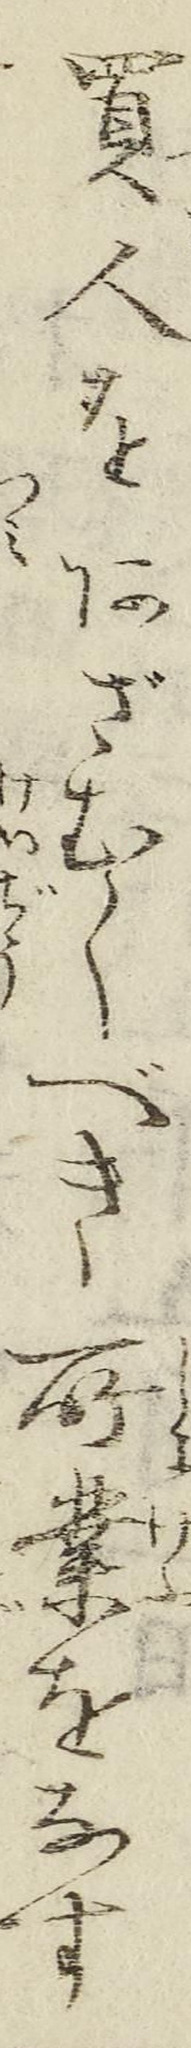買人をあざむくべき所業をなす
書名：[時計に関する冊子]
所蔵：東京大学地震研究所図書室 Earthquake Research Institute Library, The University of Tokyo, JAPAN
